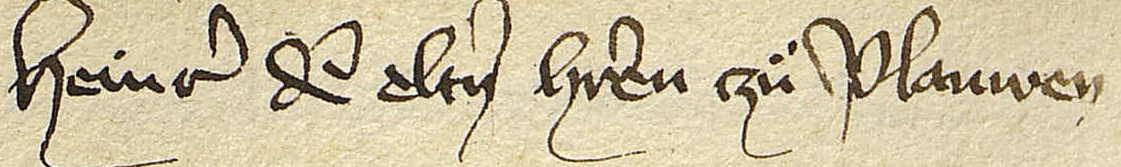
heinr* d* eltn* hr*en cʒü Plauwen
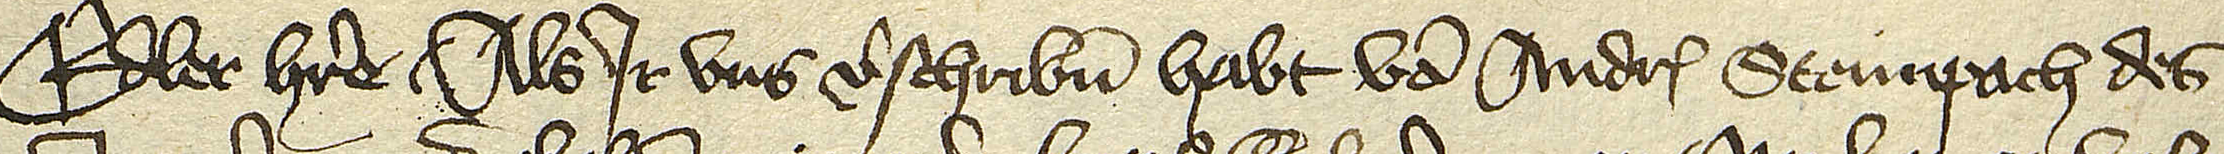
Edler hr*e / Als Ir vns v*ſchribn* habt vo* Andr* Steinpach des
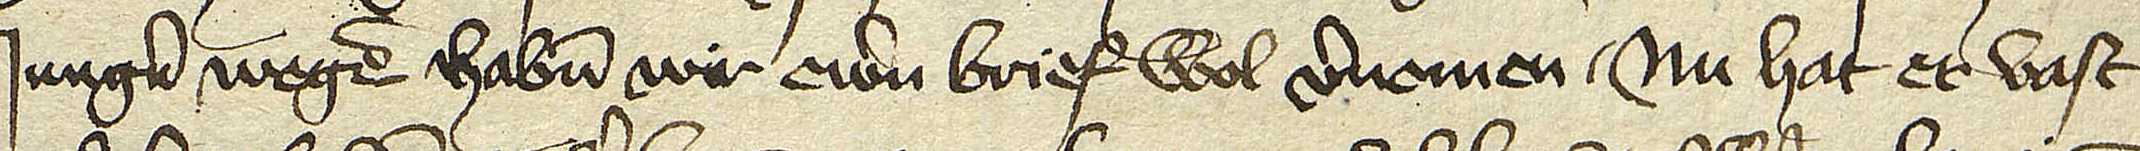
Iungn* wege* habn* wir ew*n brief wol v*nomen / Nu hat er vaſt
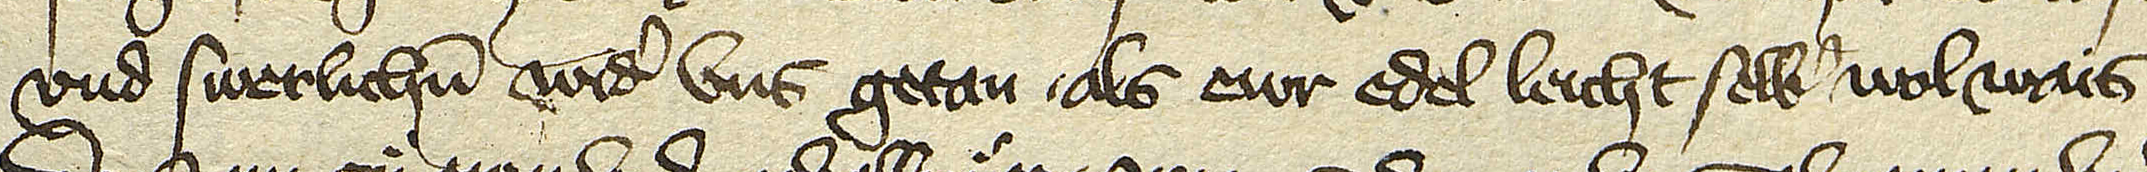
vnd ſwerlichn* wid* vns getan / als ewr edel leicht ſelb* wol wais
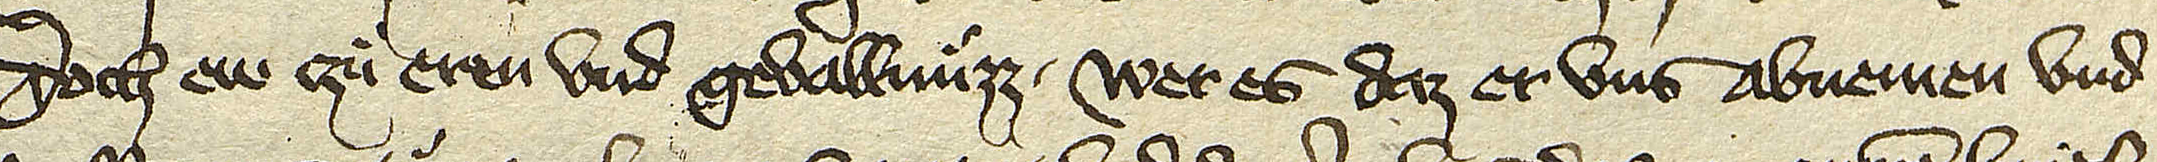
Doch ew cʒü eren vnd gevallnüʒʒ / wer es daʒ er vns abnemen vnd
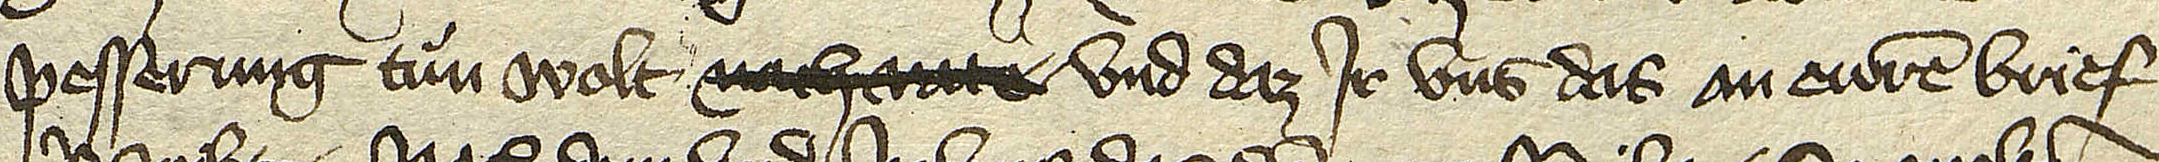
Peſſerung tün wolt nach rate / vnd daʒ Ir vns das an ewre* brief
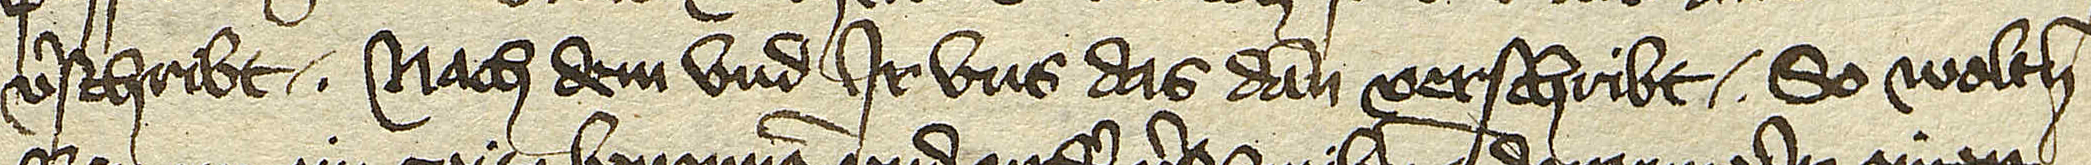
v*ſchribt / . Nach dem vnd Ir vns dan* verſchribt / So woltn*
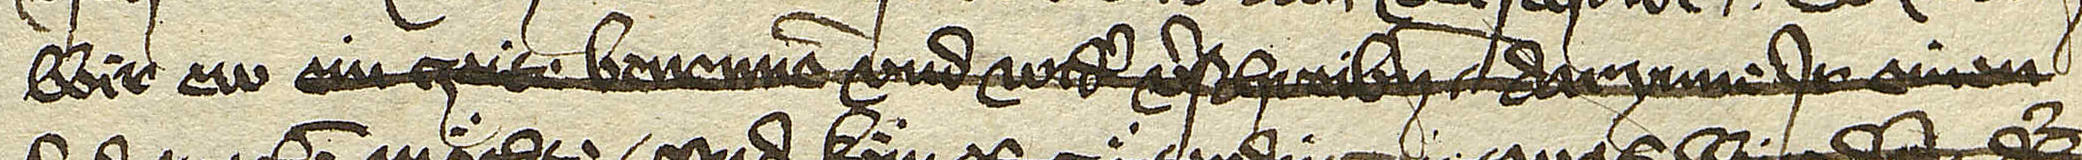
wir ew ein cʒeite benenne* vnd wid* v*ſchreibn* / darynne Ir einen
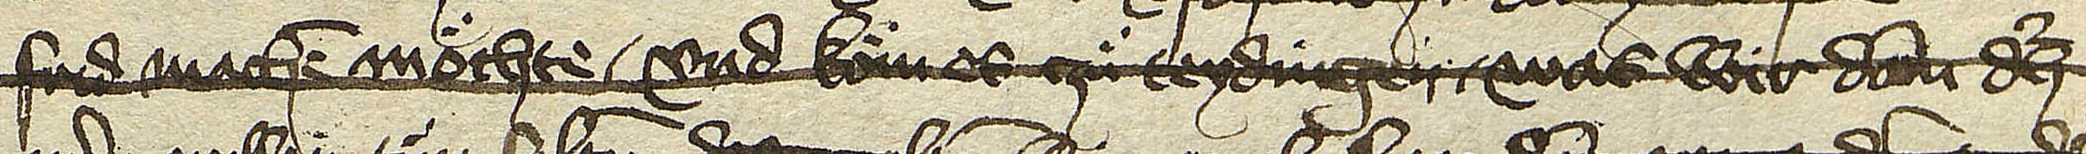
frid mache* möchte / vnd köm er cʒü teydingen / was wir dan* d*h
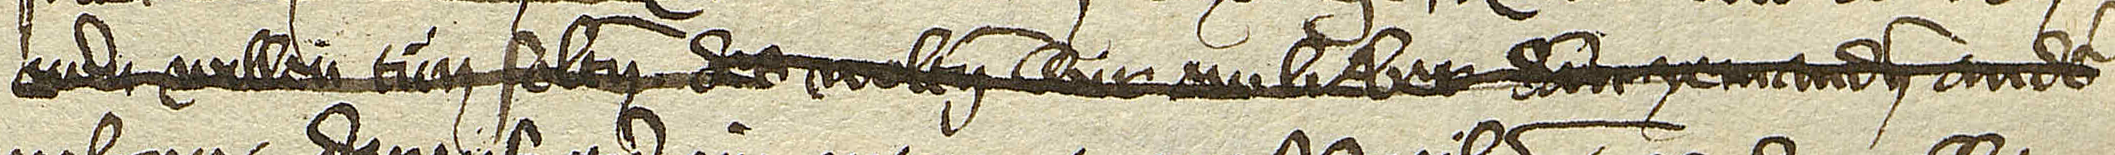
ew*n willen tun ſoltn* des woltn* wir ew lieber dan* yemandn* ands*
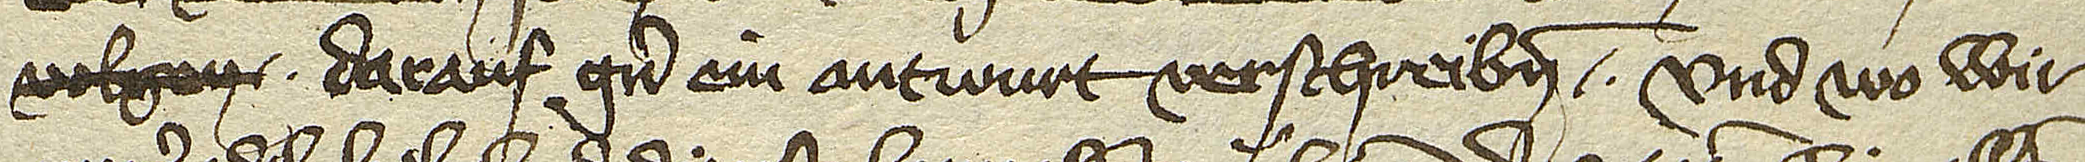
volgen / . darauf gn* ein antwurt verſchreibn* / . vnd wo wir
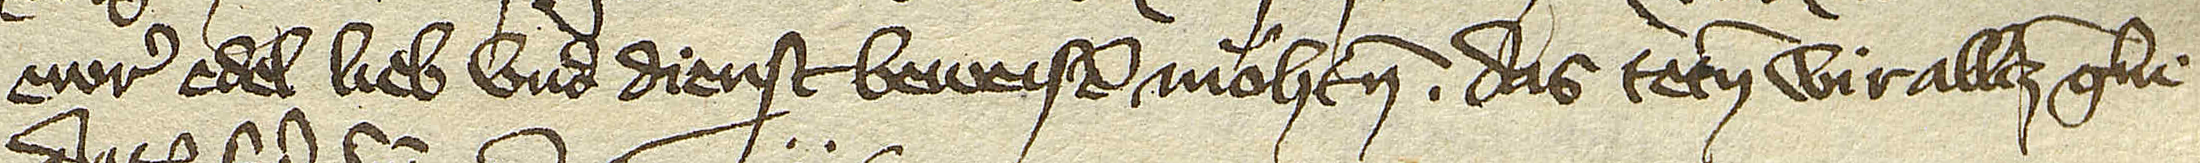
ewr* edel lieb vnd dienſt beweiſe* möhtn* . das tetn* wir allcʒ* gn*e
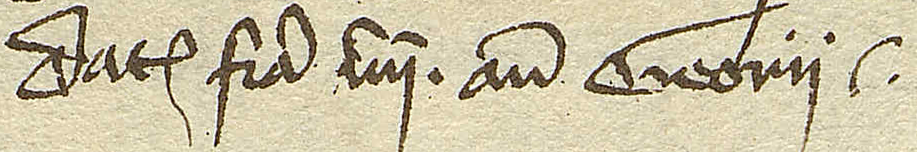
Dat* fia* iiii* . an* Georii / .
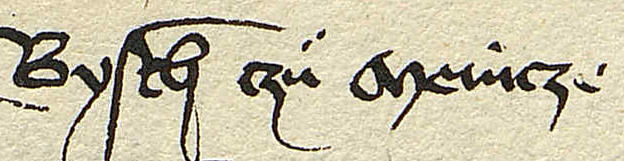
Byſch* cʒü Meincʒe
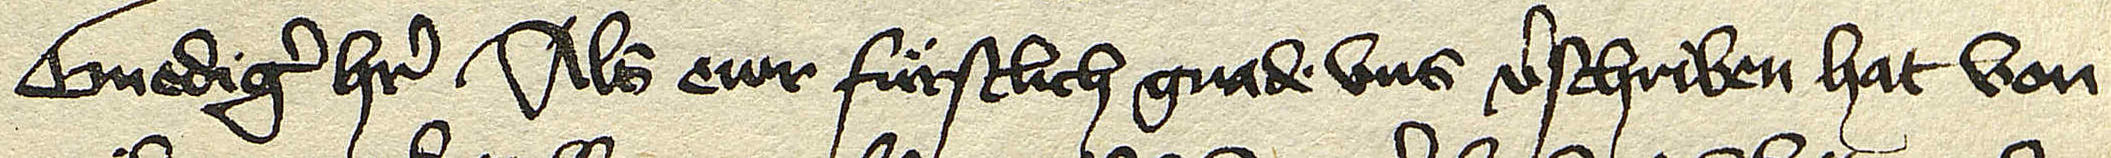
Gnedig* hr* / Als ewr fürſtlich gnade vns v*ſchriben hat von
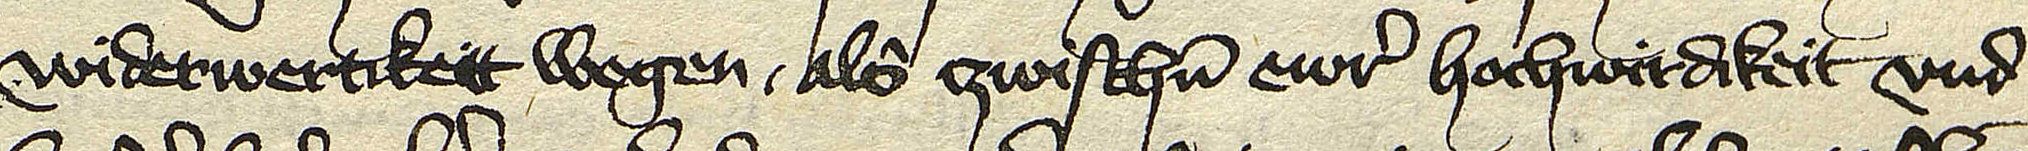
widerwertikeit wegen / als cʒwiſchn* ewr* hochwirdikeit vnd
